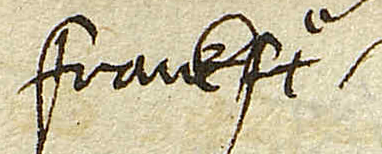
Frankft* /
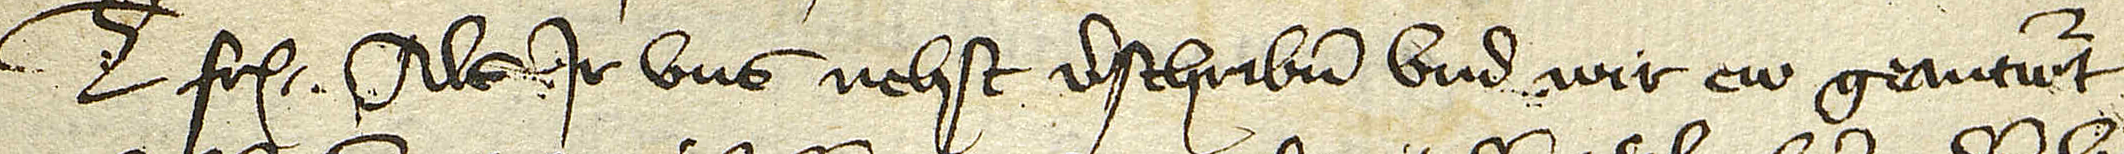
L* fr* / . Als Ir vns nehſt v*ſchribn* vnd wir ew geantwt*
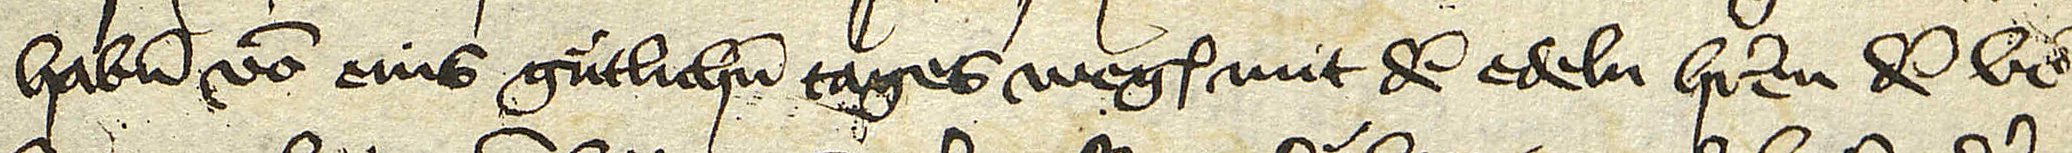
habn* vo* eins gütlichn* tages weg* mit d* edeln hr*en d* vo*
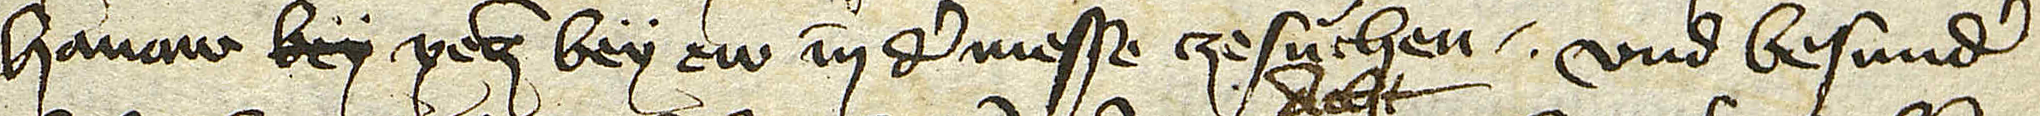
Hanaw bey yecʒ* bey ew in d* meſſe cʒeſüchen / . vnd beſund*
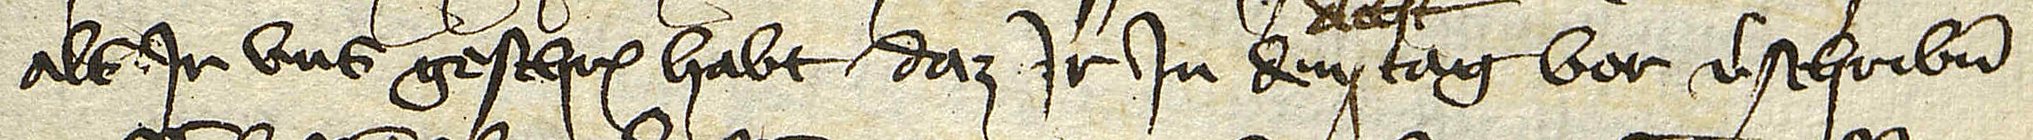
als Ir vns geſchr* habt / daʒ Ir In den tag vor v*ſchribn*
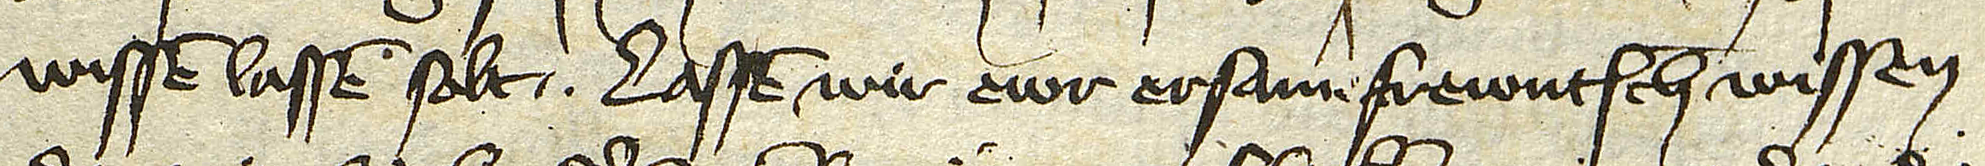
wiſſe* laſſe* ſolt / . Laſſe* wir ewr erſame frewntſch* wiſſen
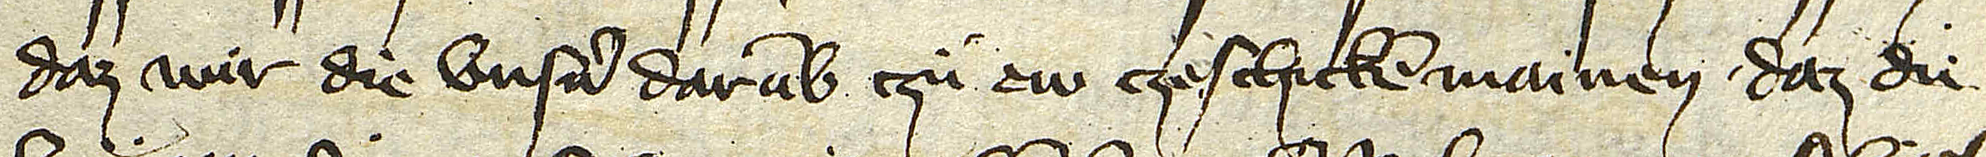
daʒ wir die vnſn* darub* cʒü ew cʒeſchicke* mainen / daʒ die
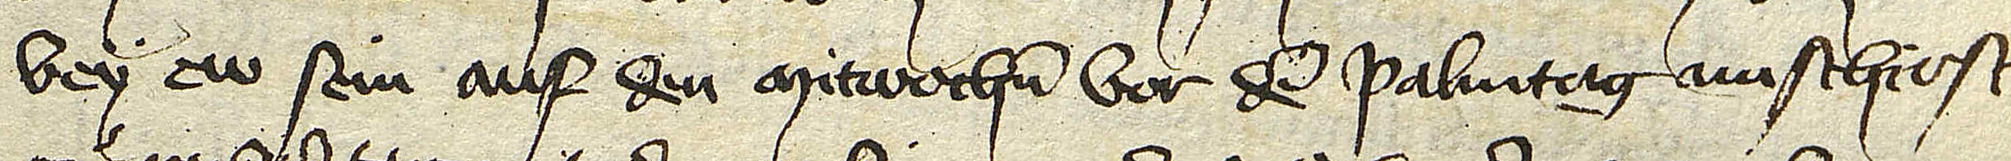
bey ew ſein auf den Mitwochn* vor d* palmtag nu ſchirſt
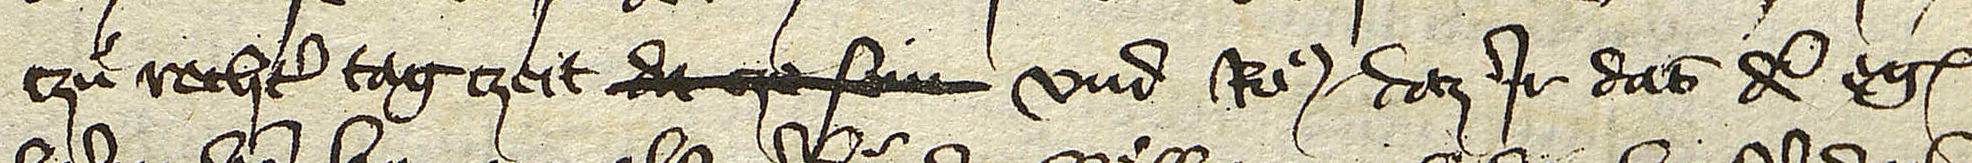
cʒü recht* cʒeit da cʒe ſein vnd Ro* / daʒ Ir das d* eg*
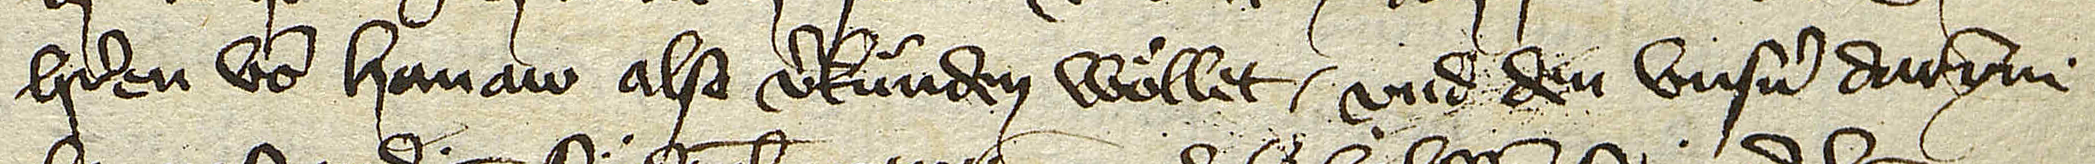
hr*en vo* Hanaw alſo v*künden wöllet / vnd den vnſn* daryne*
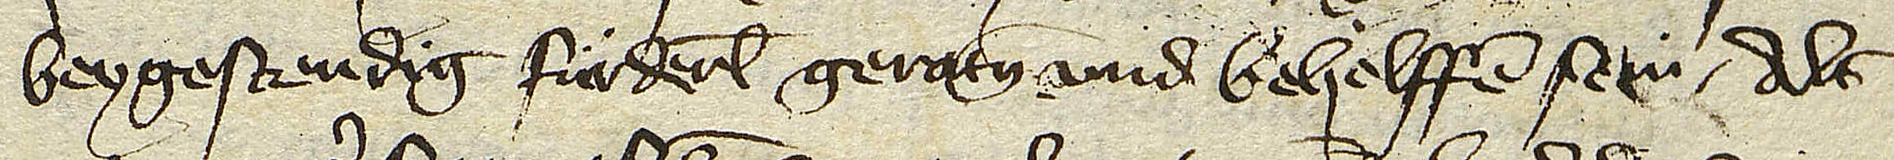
beygeſtendig fürderl* geratn* vnd behilffe* ſein / Als
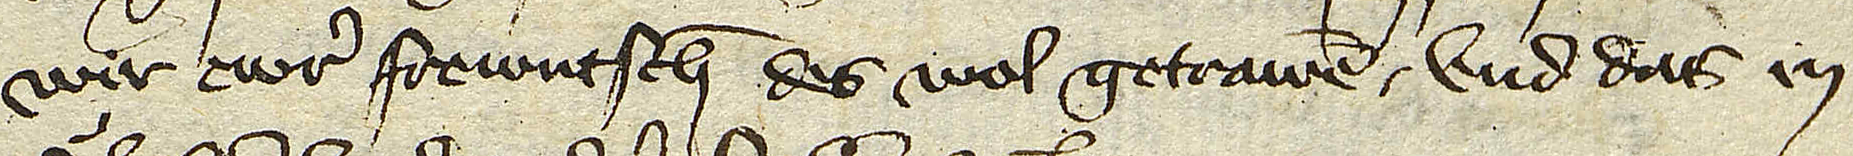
wir ewr* frewntſch* des wol getrawe* / vnd das in
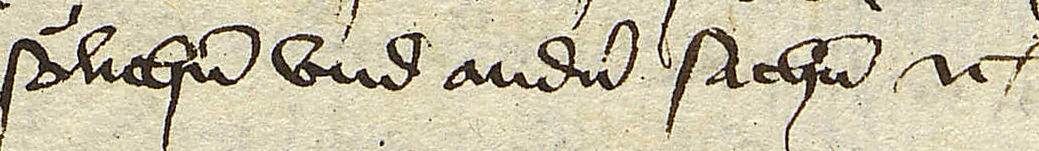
ſölichn* vnd andn* ſachn* ec*
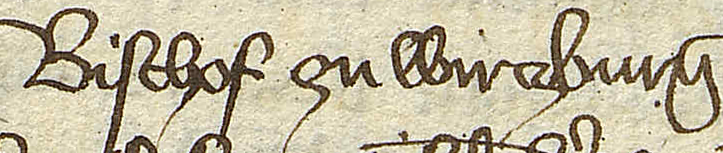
Biſchof cʒu wircʒburg
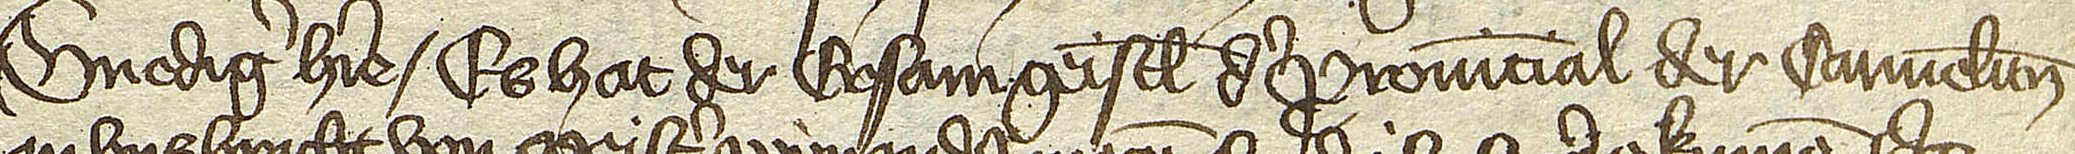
Gnedig* hr*e / Es hat der Erſam geiſtl* d* Prouicial* der Carmelitn*
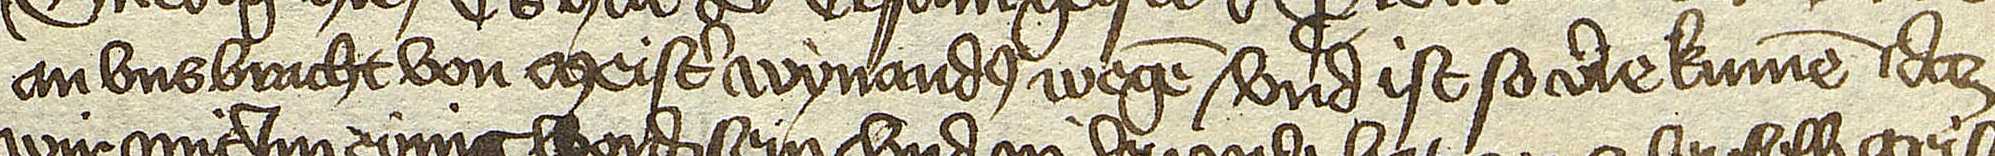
an vns bracht von Meiſt* wynand* wege* / vnd iſt ſo v*re kume* / daʒ
